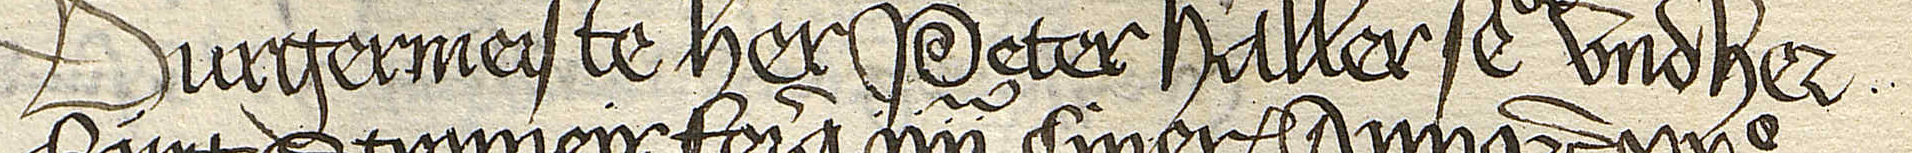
Burgermeiſte* Her Peter Haller ſe* vnd Her*
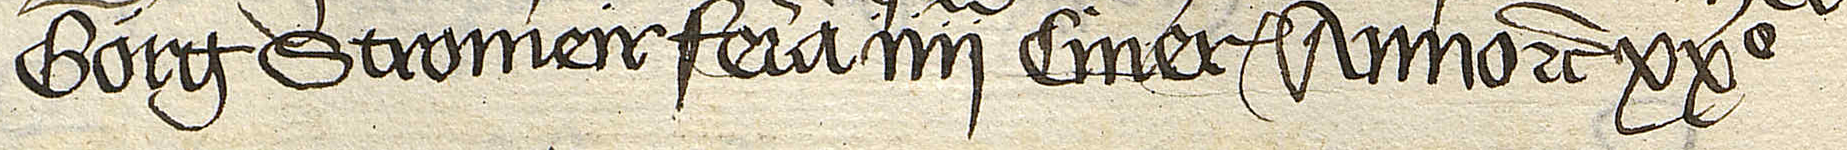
Görg Stromeir feia* iiii* Ciner* Anno ec* xx*
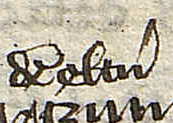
de* eltn*
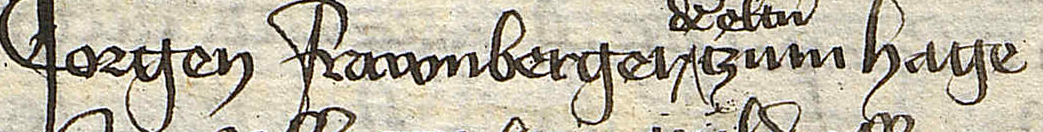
Iorgen Frawnberger cʒum hage
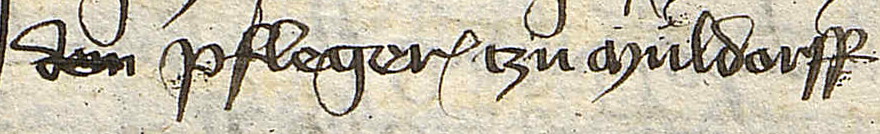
dem pfleger* cʒu Müldorff
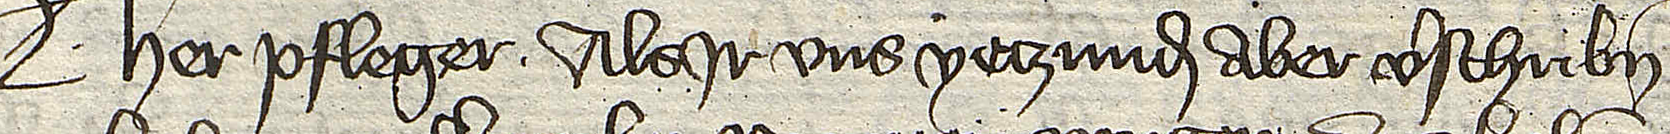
L* her pfleger . Als Ir vns yecʒund* aber v*ſchribn*
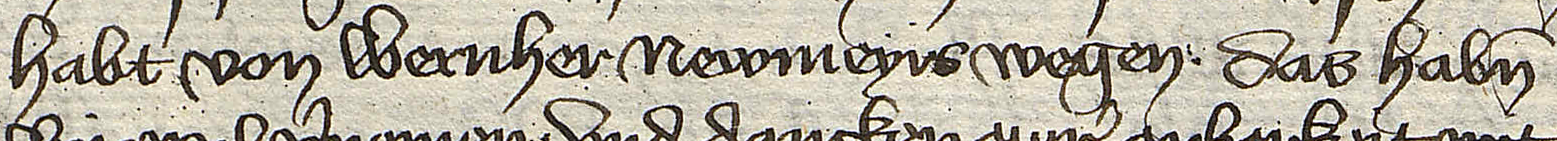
habt von Wernher Newmeyrs wegen . Das habn*
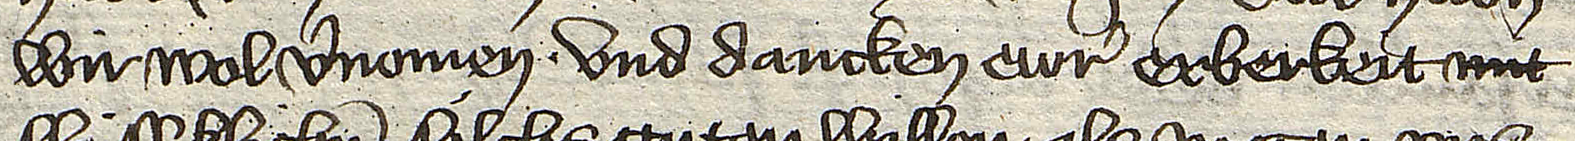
wir wol v*nomen . vnd dancken ewr* erberkeit mit
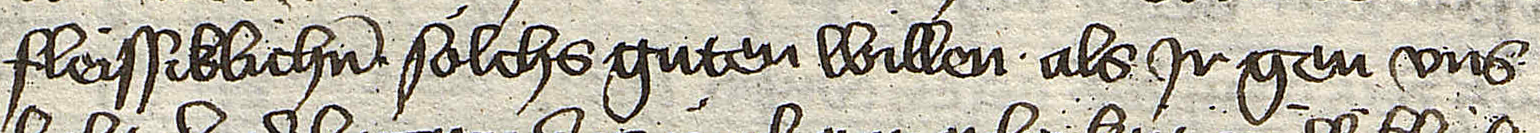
fleiſſiklichn* . ſölchs guten willen . als Ir gen vns
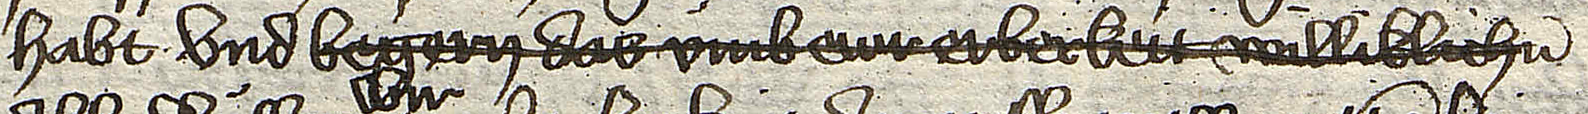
habt vnd begern das v̈mb ewr erberkeit williklichn*
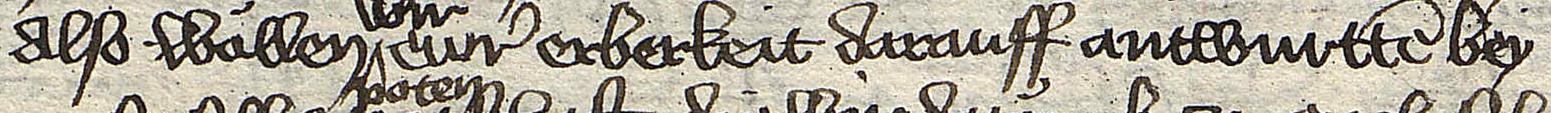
Alſo . wöllen ewr* erberkeit darauff antwurtte* bey
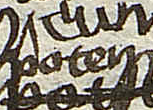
poten
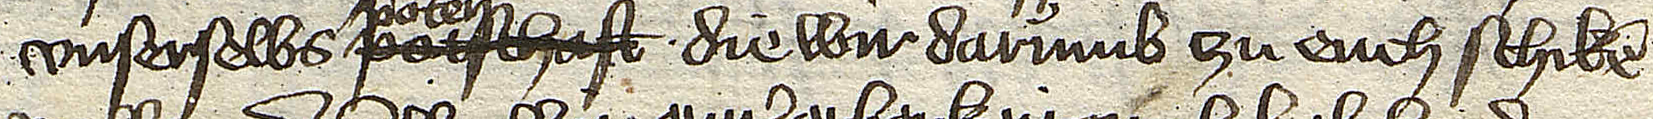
vnſerſelbs potſchaft . die wir darümb cʒu euch ſchike*
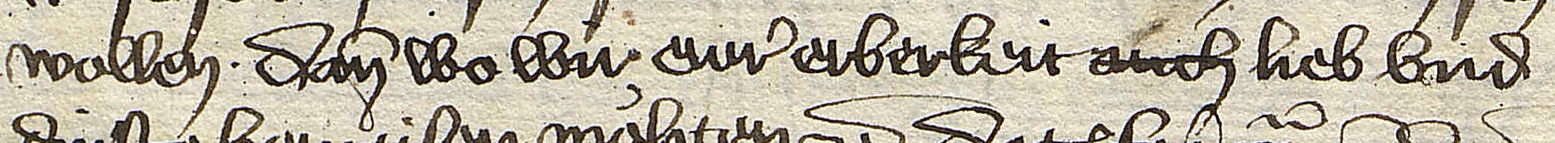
wollen . Dan* wo wir ewr* erberkeit auch lieb vnd
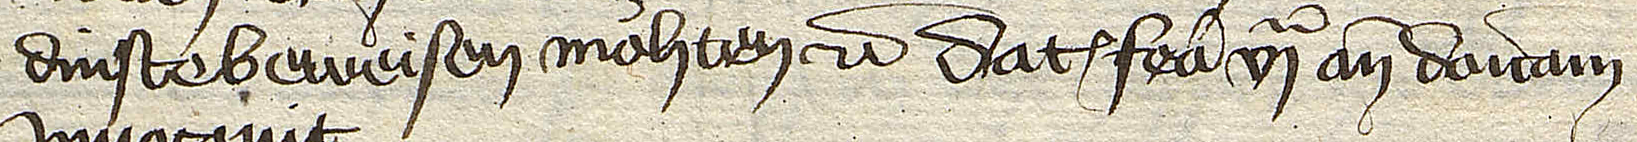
dinſte beweiſen möhten ec* Dat* fea* vi* an* doicam*
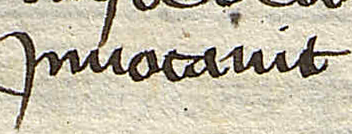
Inuocauit
